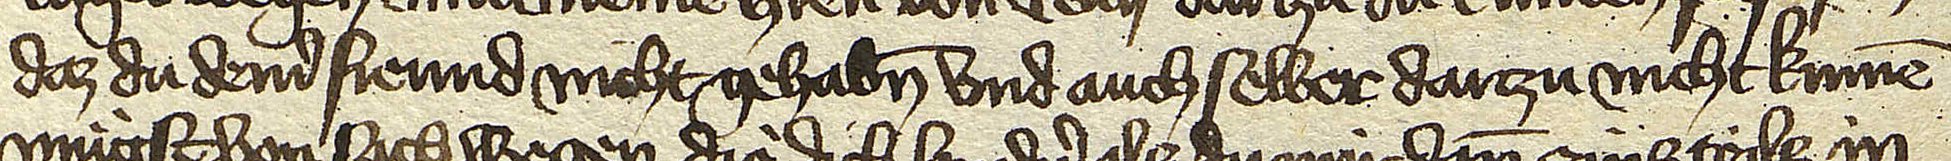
daʒ du dein* freund nicht gehabn* vnd auch ſelber darcʒu nicht kume*
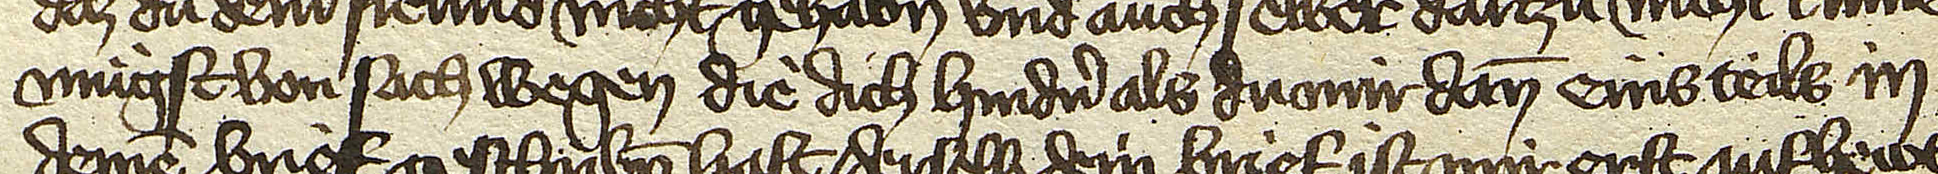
mügſt von ſach wegen die dich hindn* als du mir dan* eins teils in
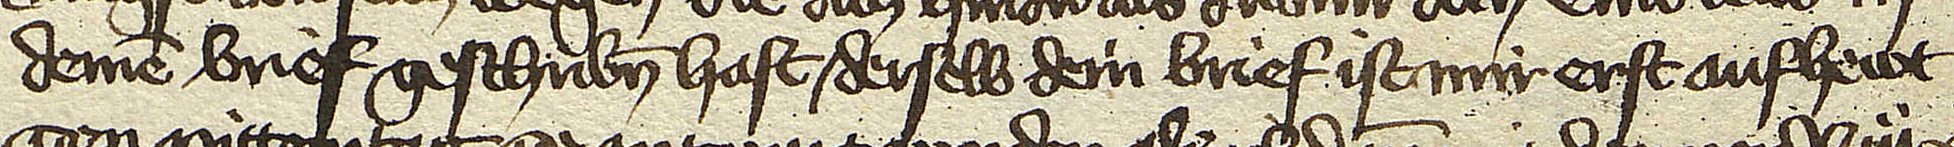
deine* brief geſchribn* haſt / derſelb dein brief iſt mir erſt aufhewt
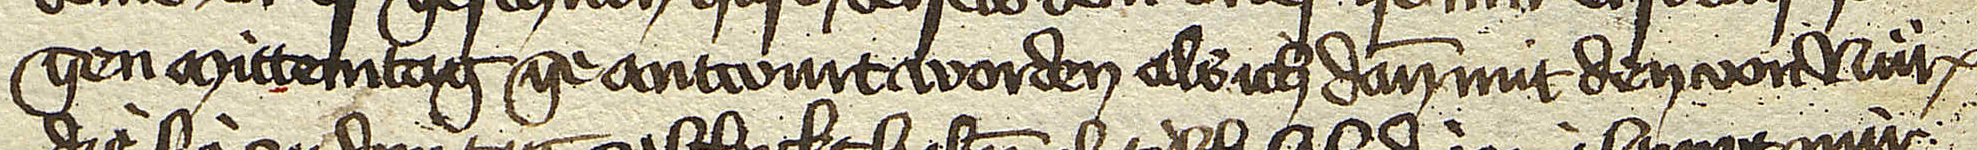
gen Mittemtag ge antwurt worden als ich dan* mit den von Nür*
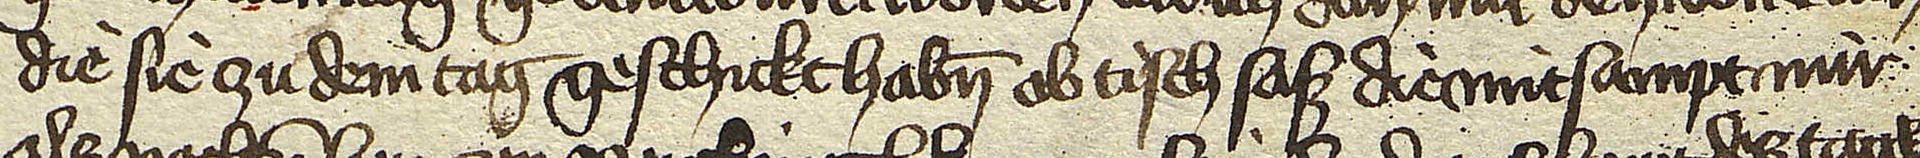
die ſie cʒu dem tag geſchickt habn* ob tiſch saſʒ die mitſampt mir
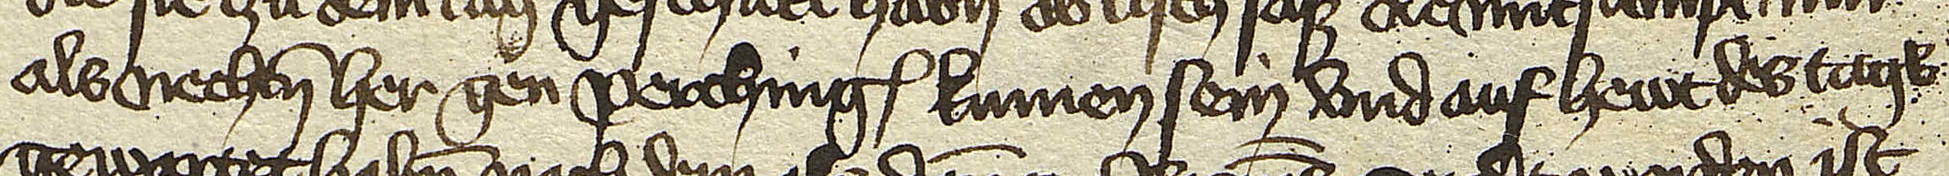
als nechtn* her gen perching* kumen ſein vnd auf hewt des tags
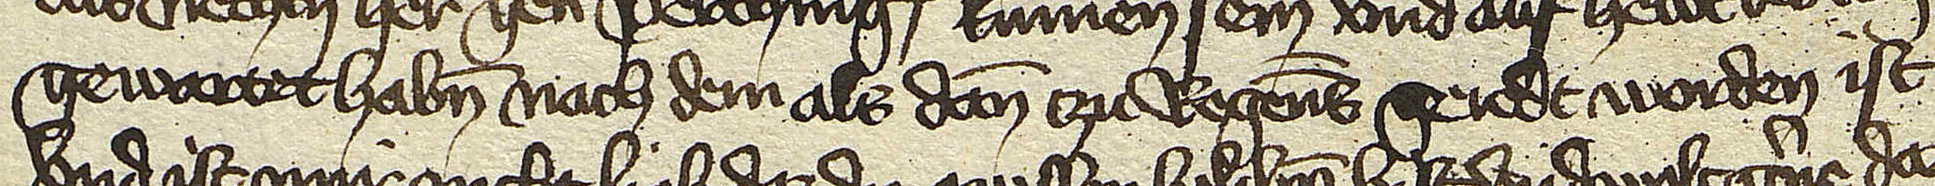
gewartet habn* nach dem als dan* cʒu Regens* geredt worden iſt
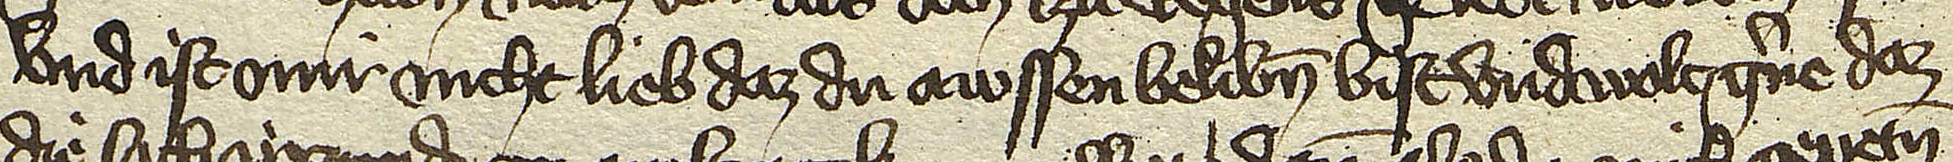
vnd iſt mit nicht lieb daʒ du awſſen belibn* biſt vnd wolt g*ne daʒ
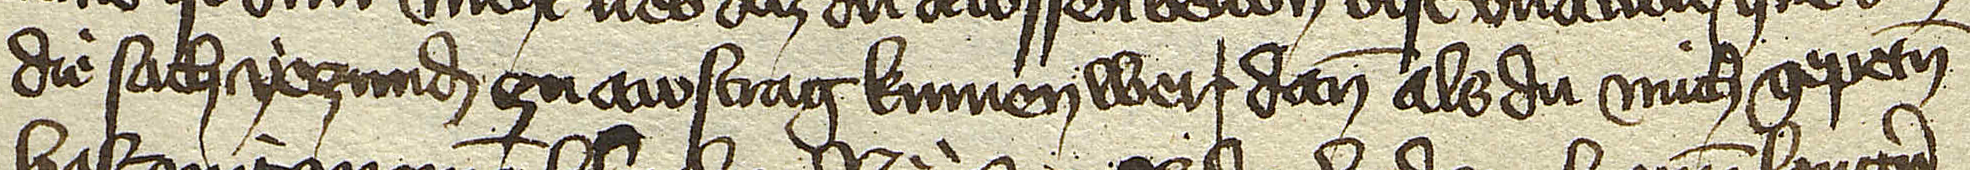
die ſach yecʒund* cʒu awſtrag kumen wer / dan* du mich gepetn*
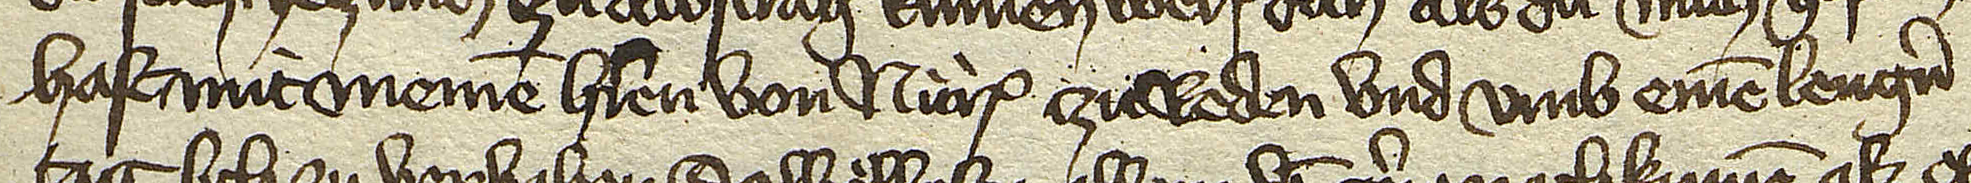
haſt mit meine* hr*en von Nür* cʒu Reden vnd vmb eine* lengn*
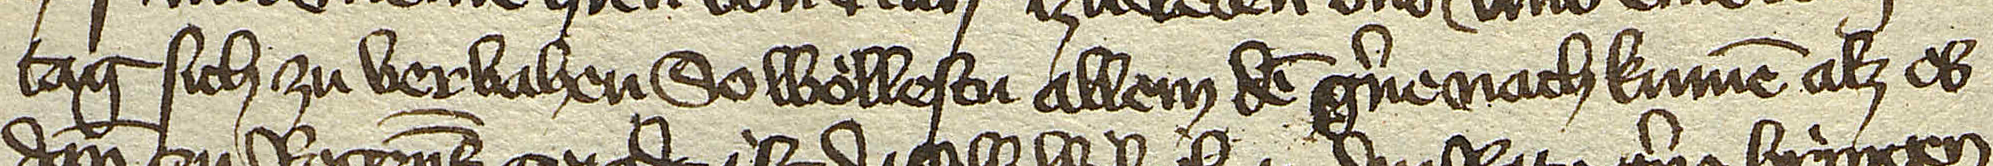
tag ſich cʒu vervahen So wölleſtu allem d* g*ne nach kume* alʒ es
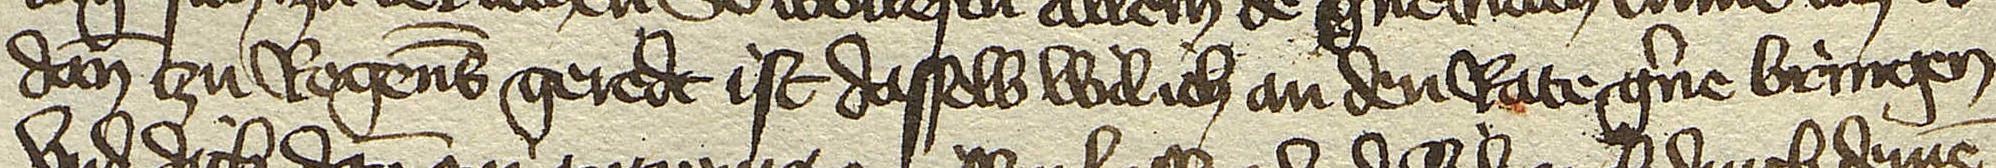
dan* cʒu Regens* geredt iſt daſſelb wil ich an den Rate g*ne bringen
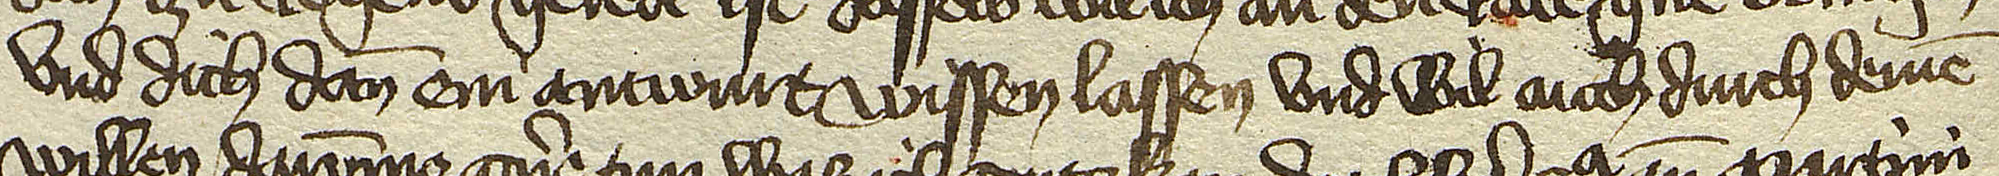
vnd dich dan* ein antwurt wiſſen laſſen vnd wil auch durch deine*
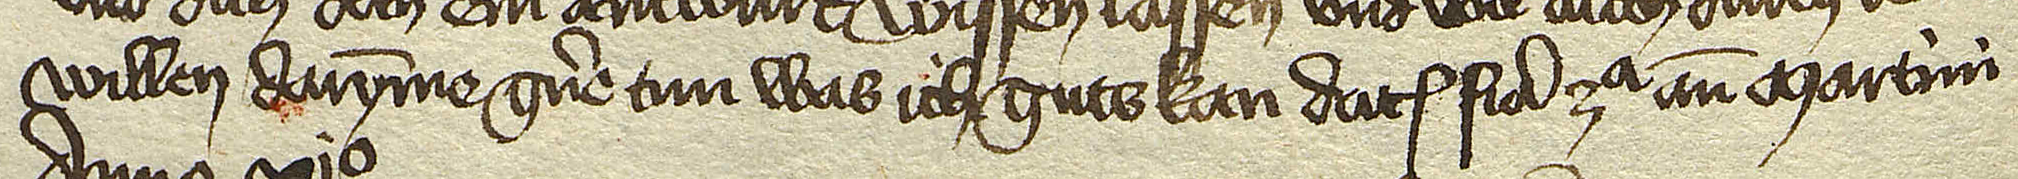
willen daryme gn*e tun was ich guts kan dat* fia* ʒ* an* Martini
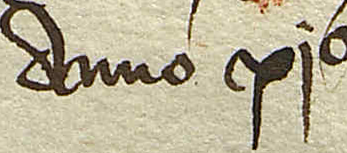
Anno xi*
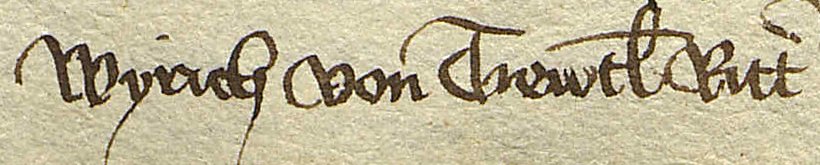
wyrich von Trewtl* Ritt*
